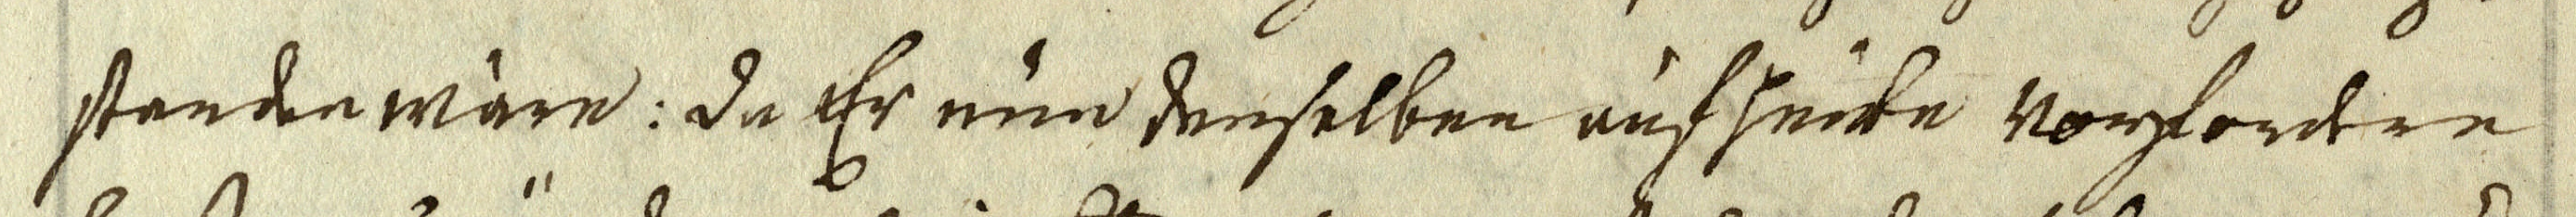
standen wäre: Da Er nun denselben auf heute vorfordern
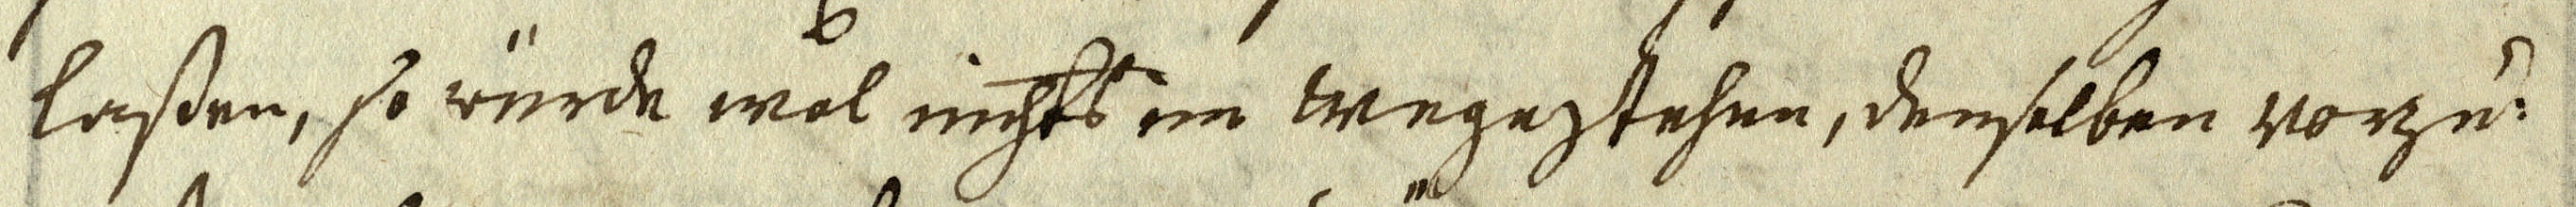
laßen, so würde wol nichts im wegestehen, denselben vorzu¬
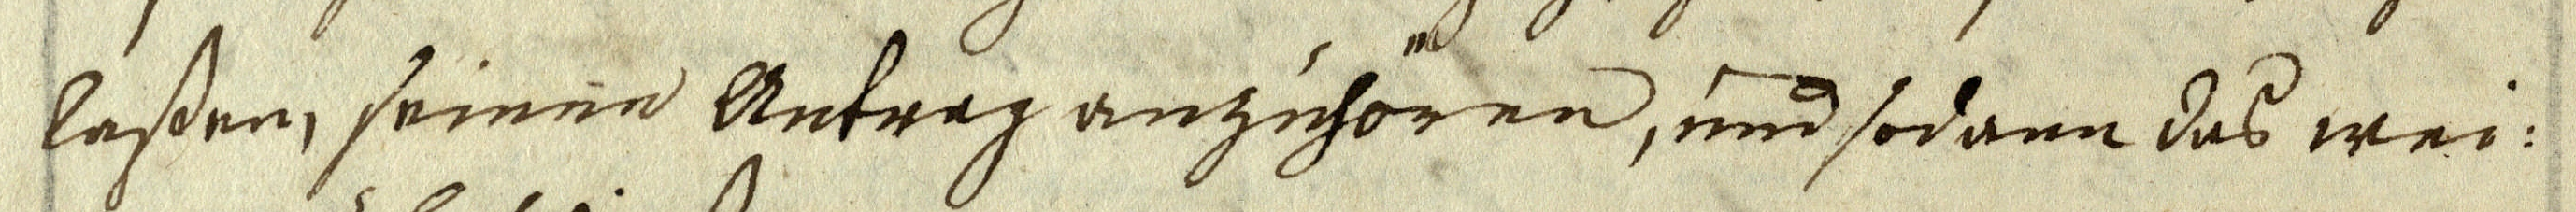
laßen, seinen Antrag anzuhören, und sodann das wei¬
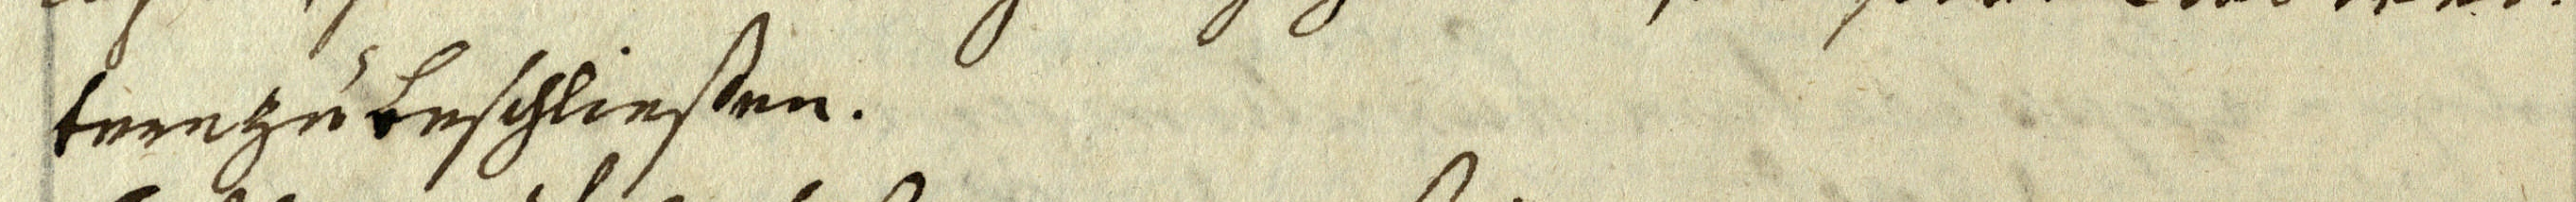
tere zu beschließen.
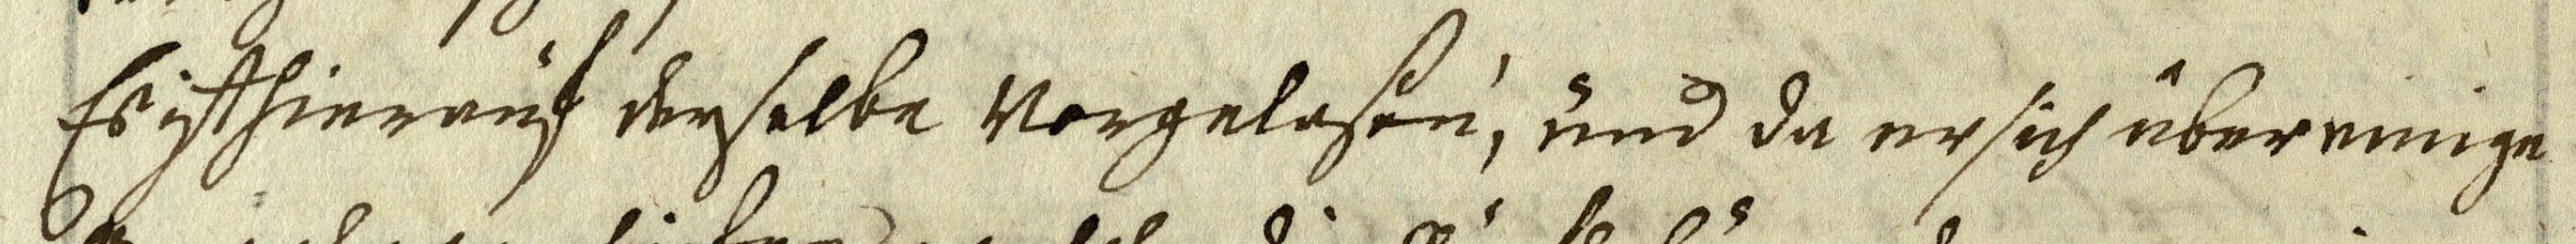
Es ist hierauf derselbe vorgelasen, und da er sich über einige
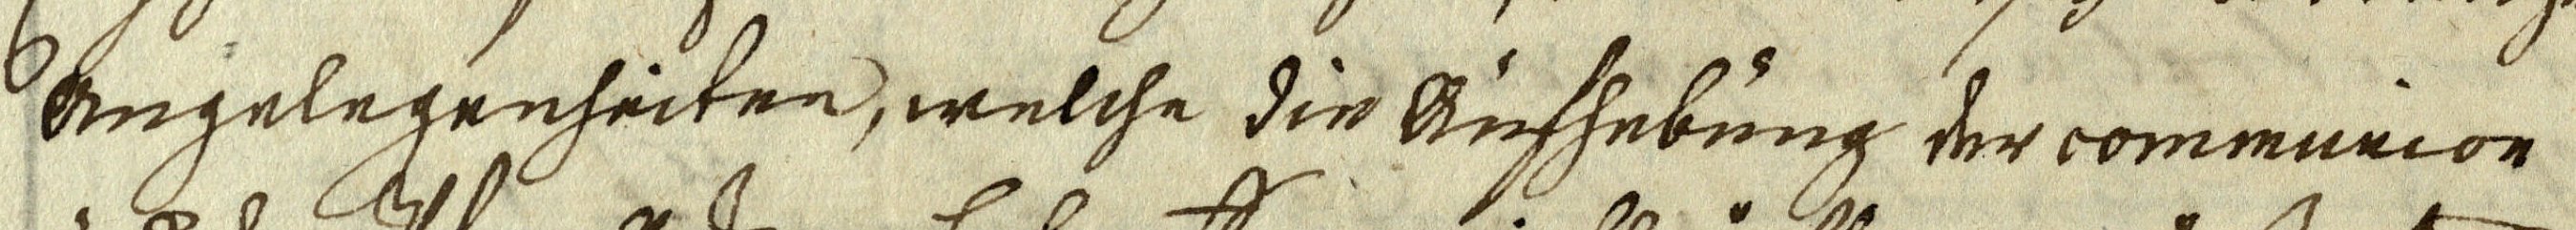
Angelegenheiten, welche die Aufhebung der communion
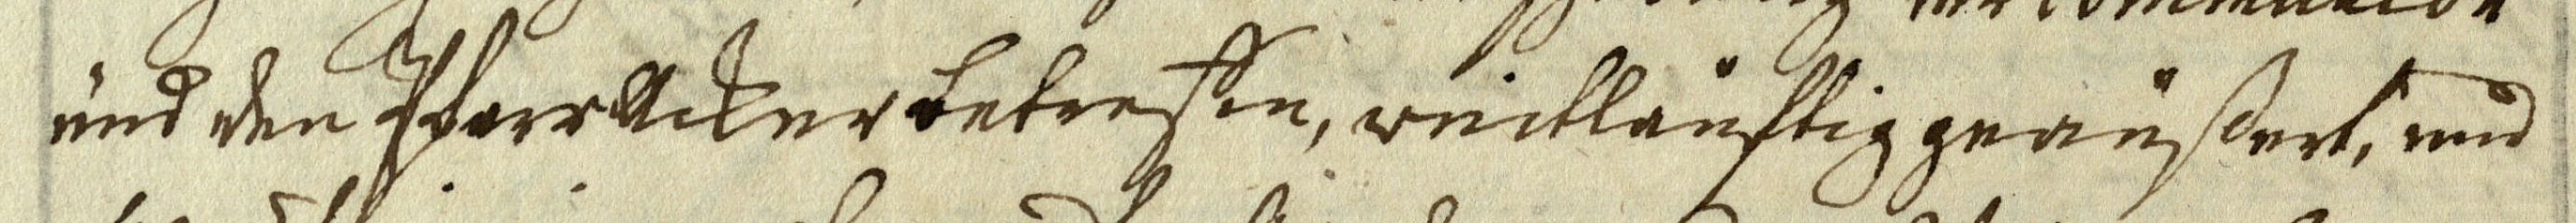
und den PfarrAcker betreffen, weitläufig geäußert, und
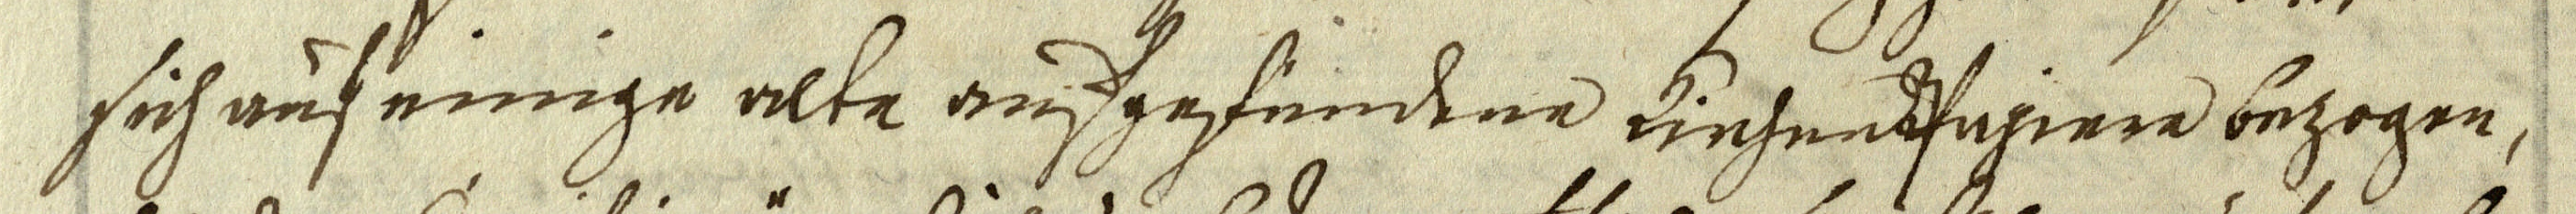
sich auf einige alte aufgefundene KirchenPapiere bezogen,
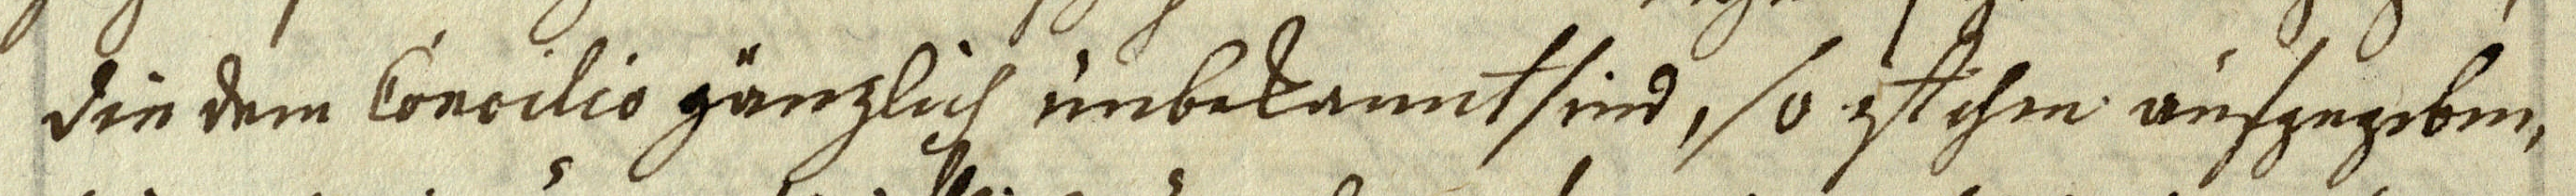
die dem Concilio gänzlich unbekannt sind, so ist ihm aufgegeben,
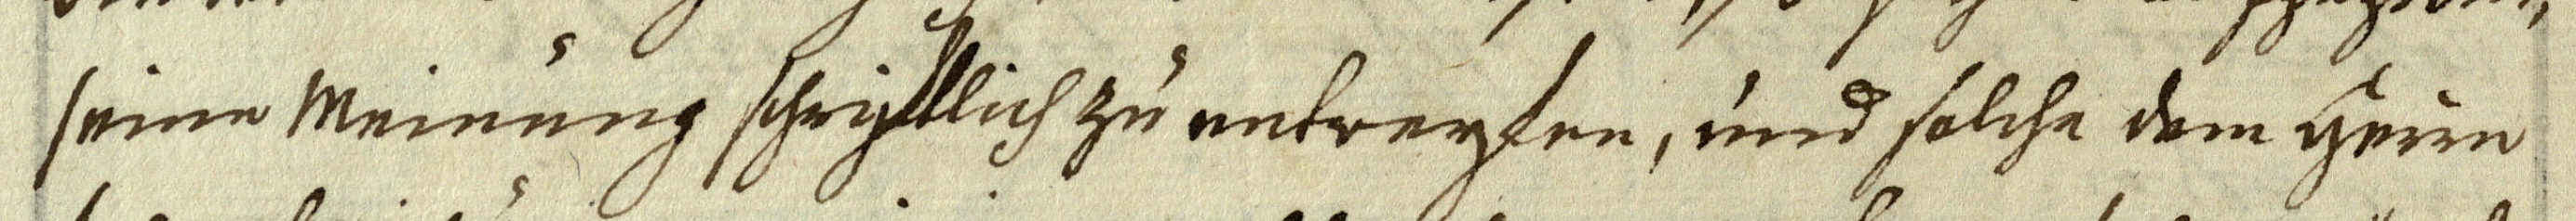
seine Meinung schriftlich zu entwerfen, und solche dem Herrn
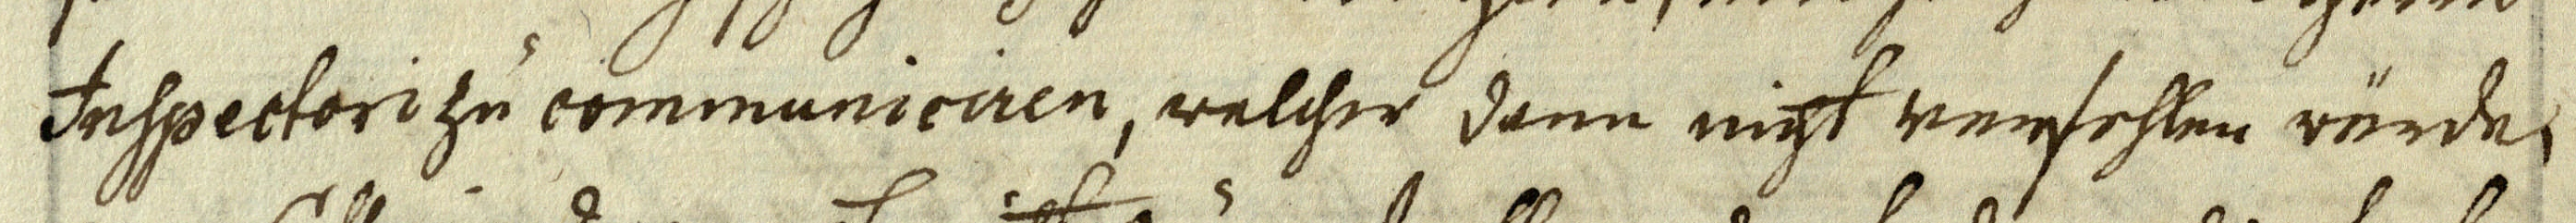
Inspectori zu communiciren, welcher dann nicht verfehlen würde,
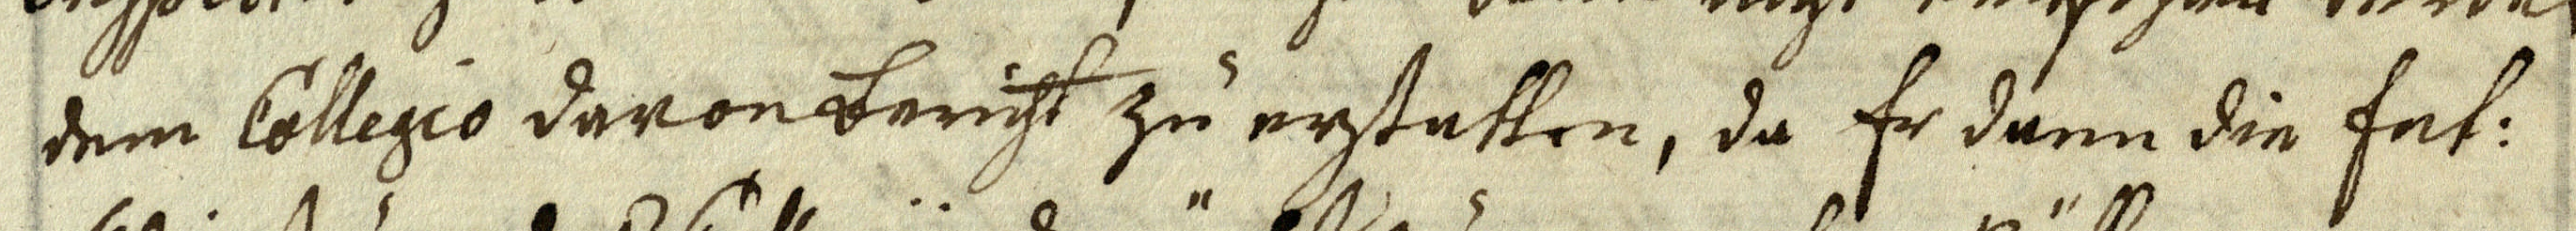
dem Collegio davon Bericht zu erstatten, da Er dann die Ent¬
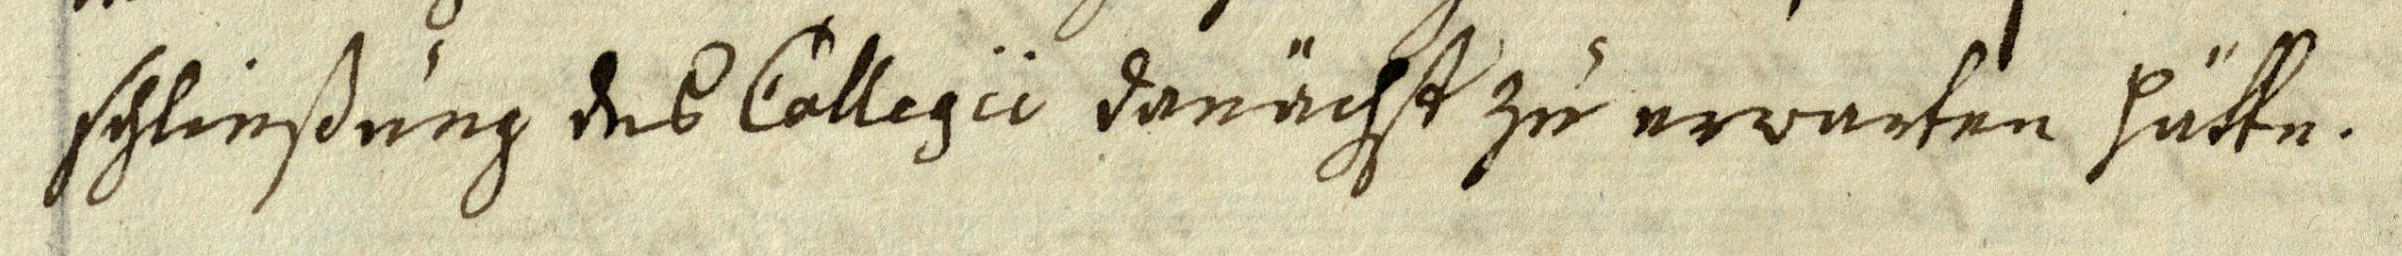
schließung des Collegii danächst zu erwarten hätte.
